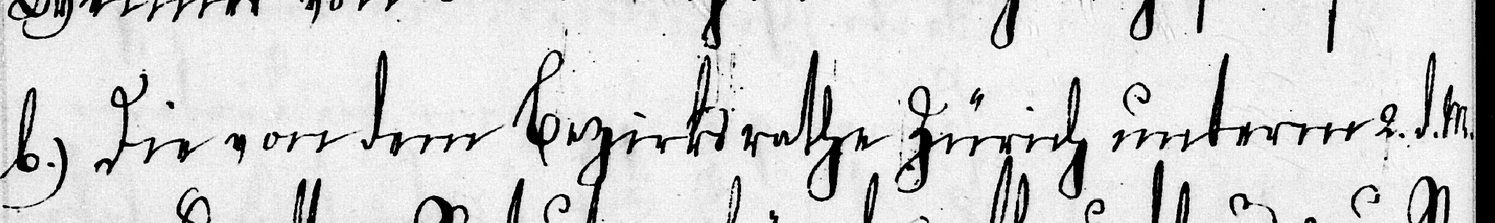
b.) Die von dem Bezirksrathe Zürich unterm 2. d.
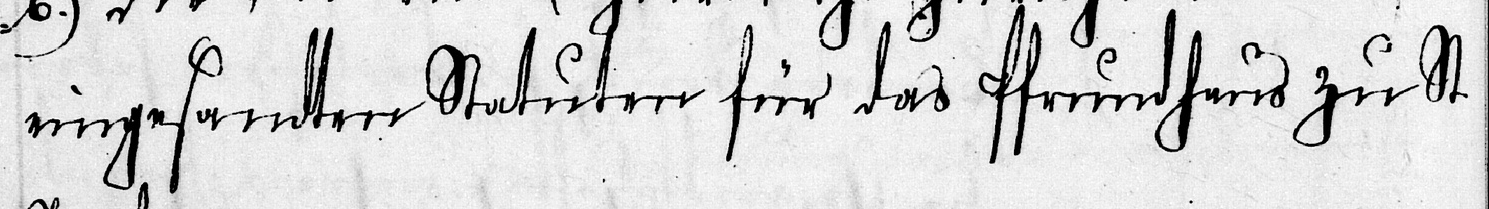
eingesandten Statuten für das Pfrundhaus zu St.
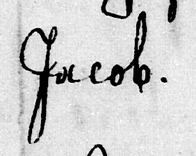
Jacob.
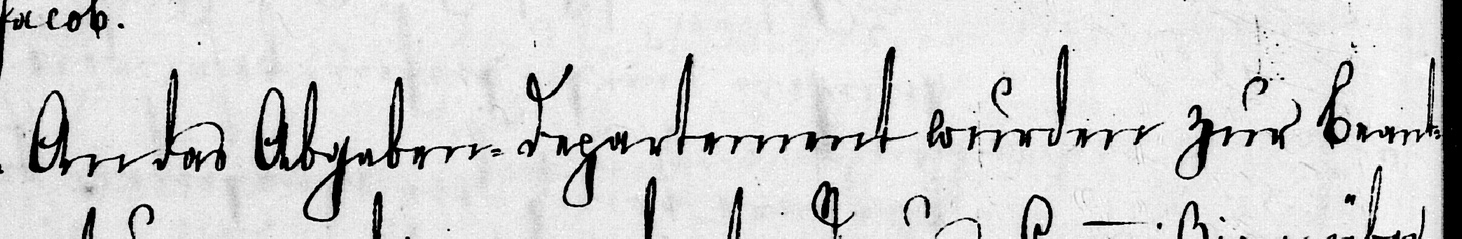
An das Abgaben-Departement wurden zur Beant¬
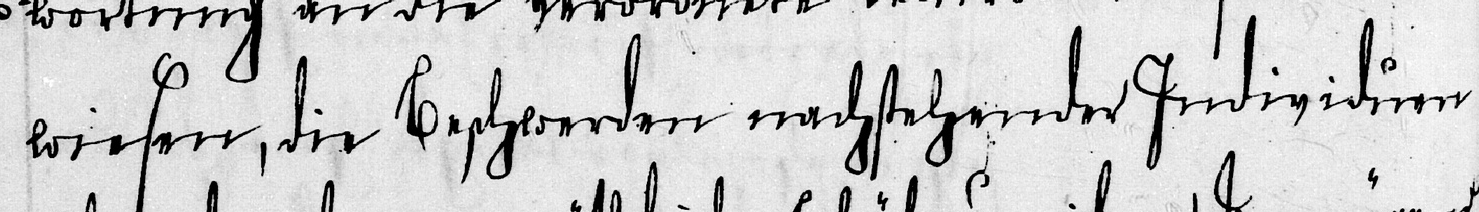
rwiesen, die Beschwerden nachstehender Individuen
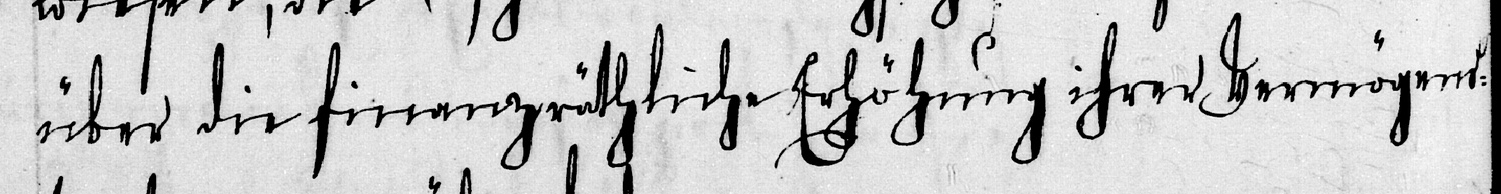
über die finanzräthliche Erhöhung ihrer Vermögens¬
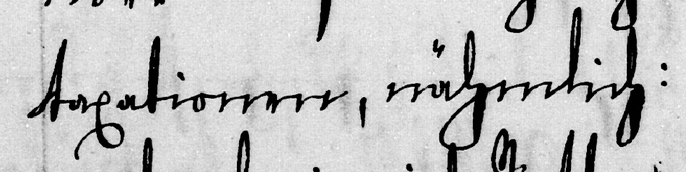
taxationen, nähmlich:
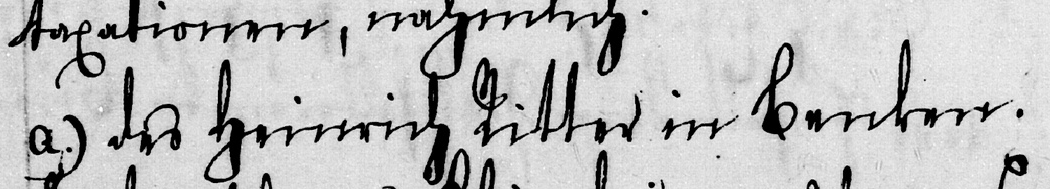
a.) des Heinrich Ritter in Benken.
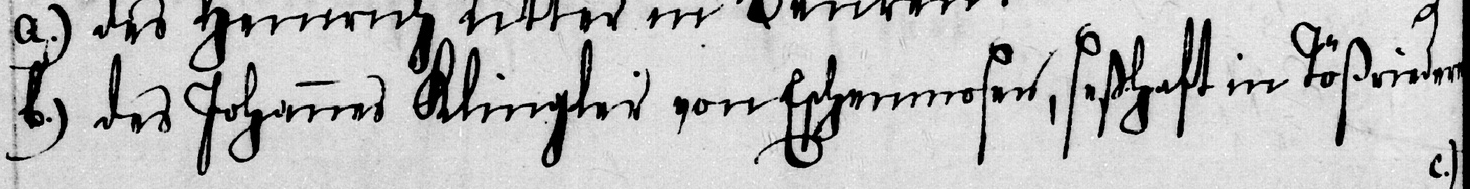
b.) des Johannes Klingler von Eschenmosen, seßhaft in Tößriede¬
